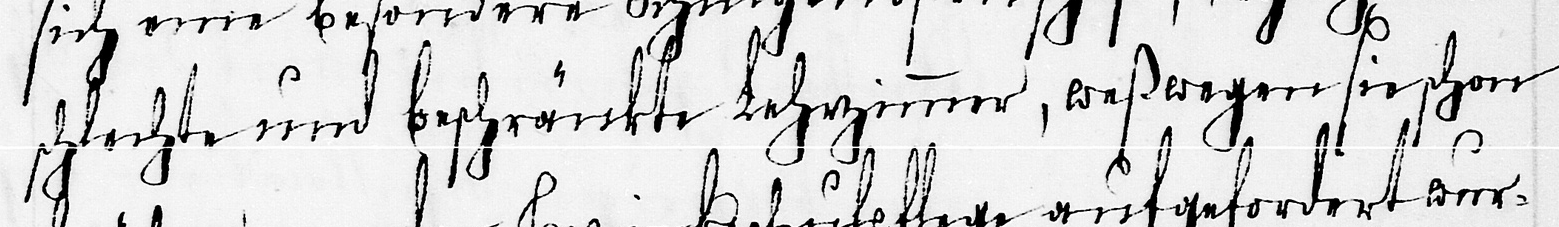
schlechte und beschränkte Lehrzimmer, weßwegen sie schon
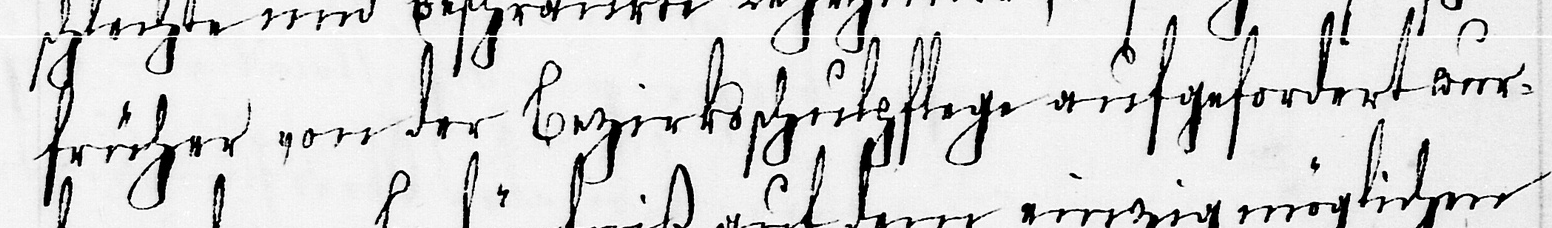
früher von der Bezirksschulpflege aufgefordert wur¬
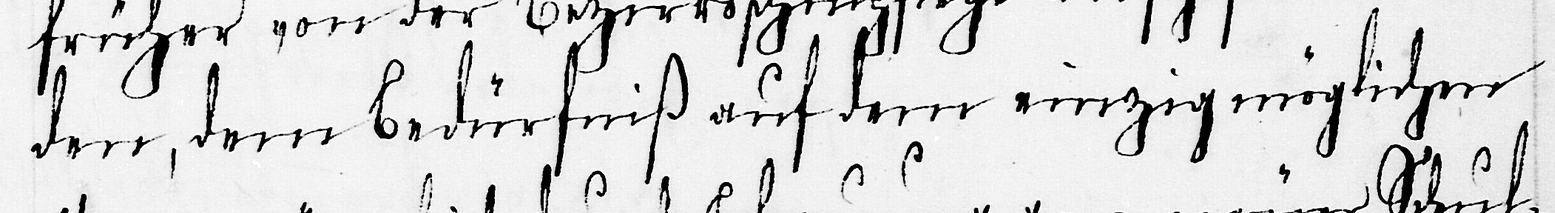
den, dem Bedürfniß auf dem einzig möglichen
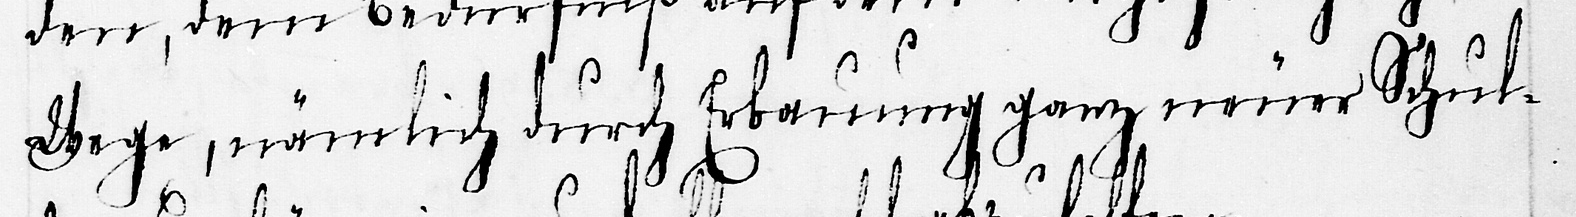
Wege, nämlich durch Erbauung ganz neuer Schul¬
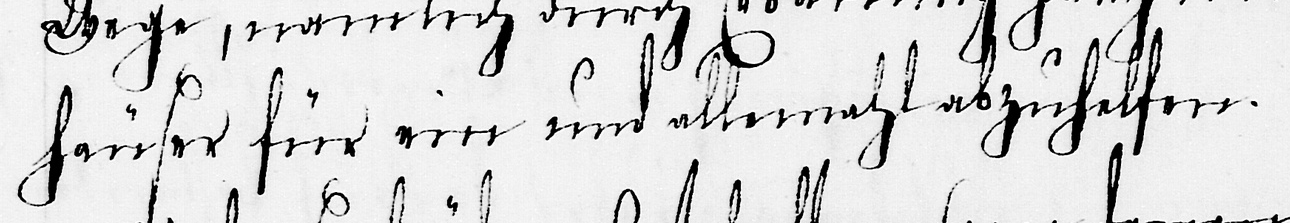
häuser für ein und allemahl abzuhelfen.
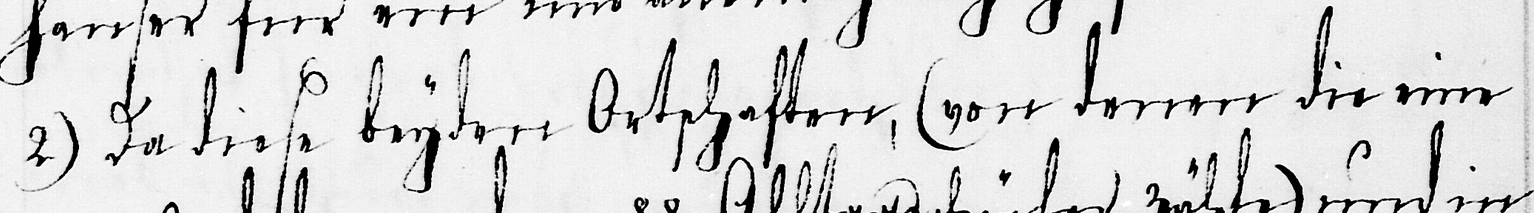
2.) Da diese beyden Ortschaften, (von denen die eine
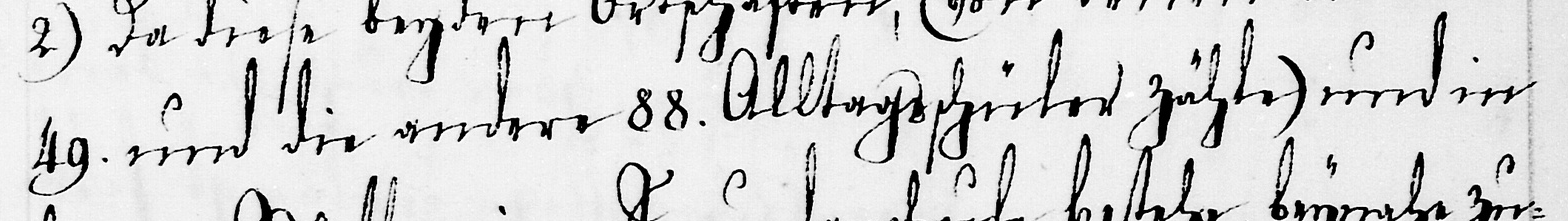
49. und die andere 88. Alltagsschüler zähle) und in
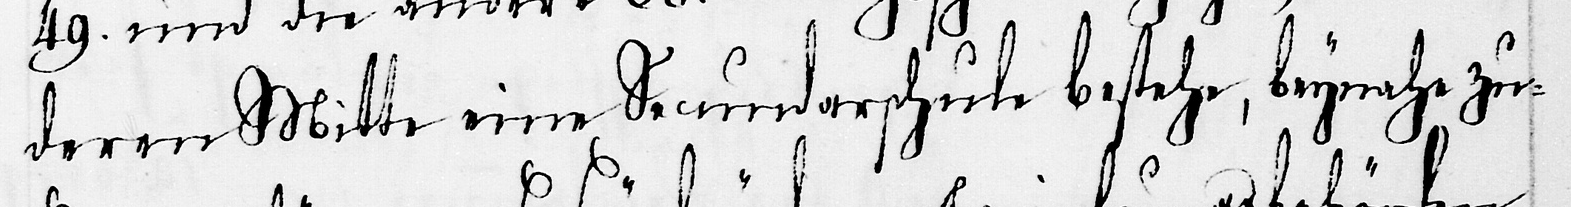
deren Mitte eine Secundarschule bestehe, beynahe zu¬
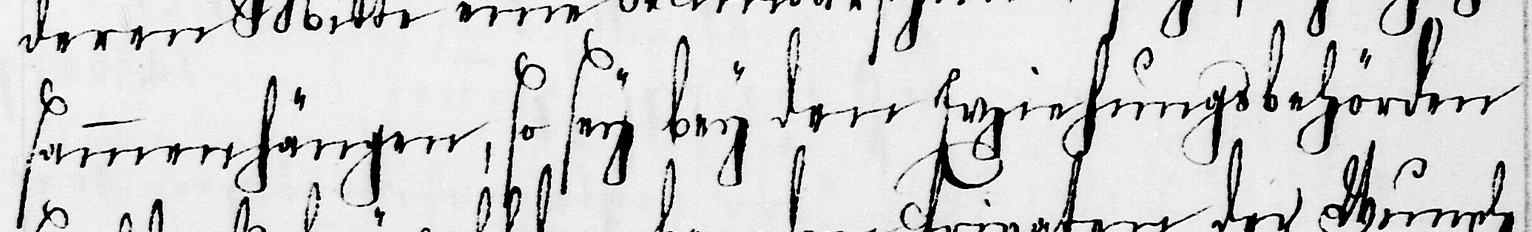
sammenhängen, so sey bey den Erziehungsbehörden
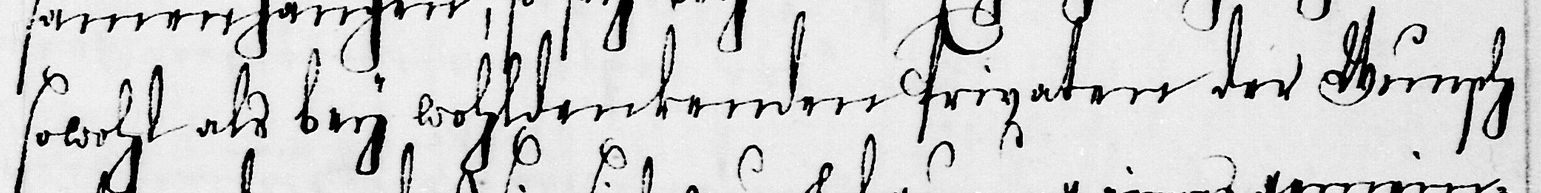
sowohl als bey wohldenkenden Privaten der Wunsch
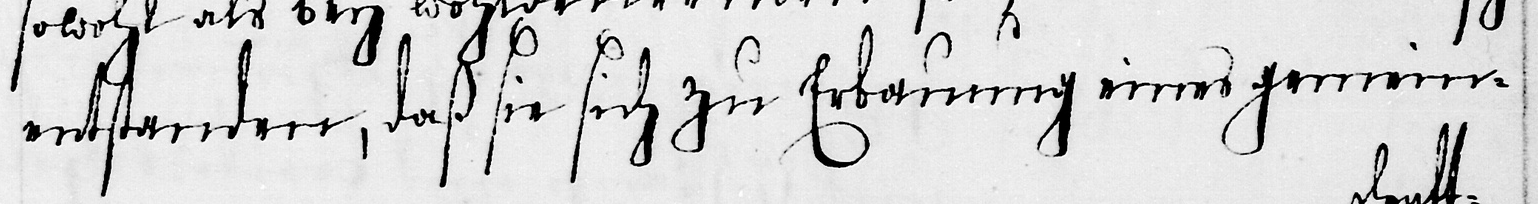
entstanden, daß sie sich zu Erbauung eines gemein-
